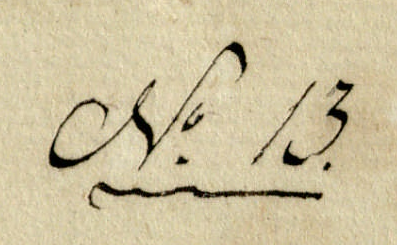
No 13.
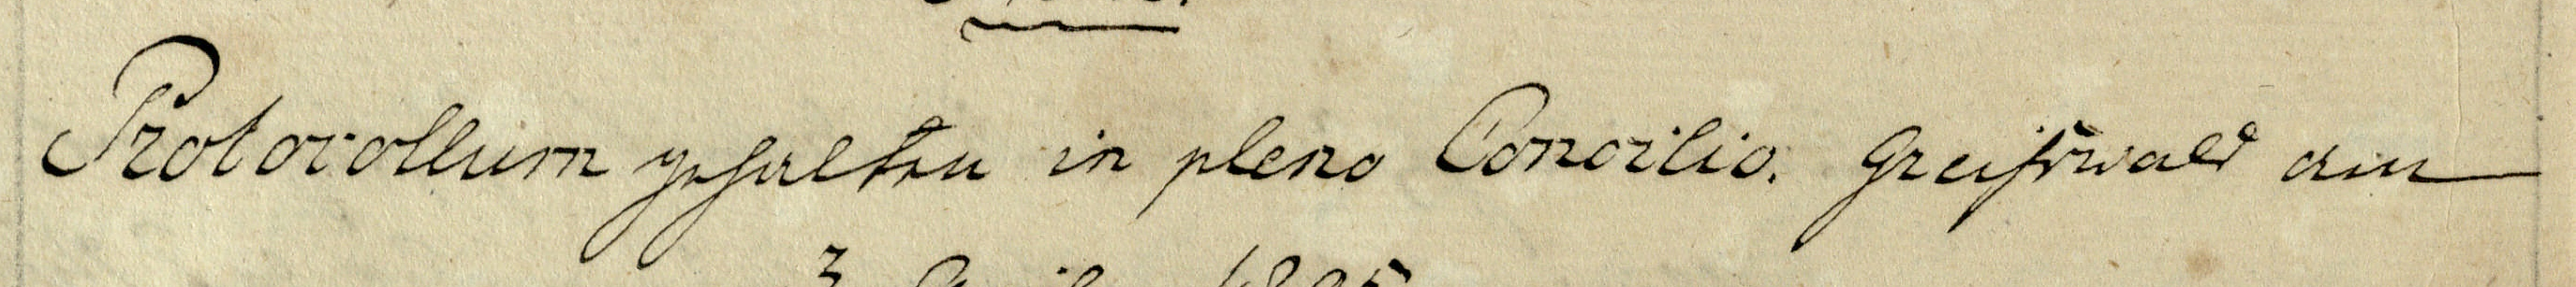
Protocollum gehalten in pleno Concilio. Greifswald am
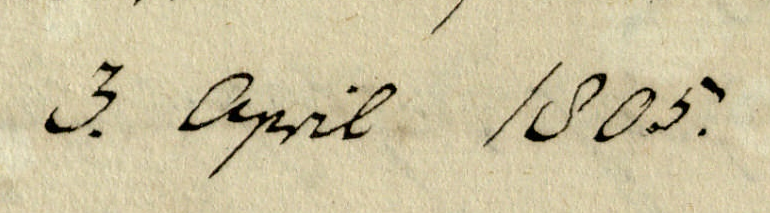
3. April 1805.
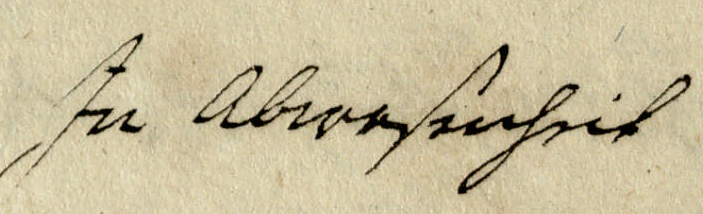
In Abwesenheit
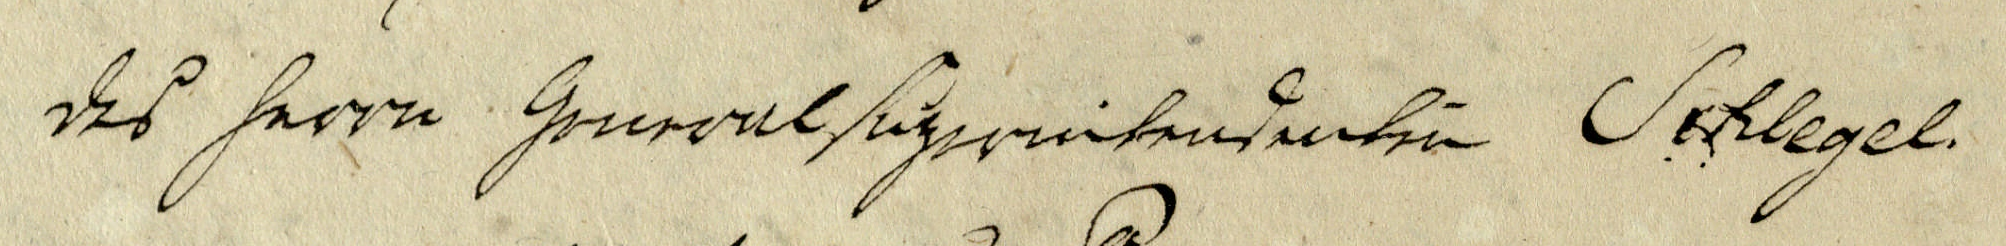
des Herrn Generalsuperintendenten Schlegel.
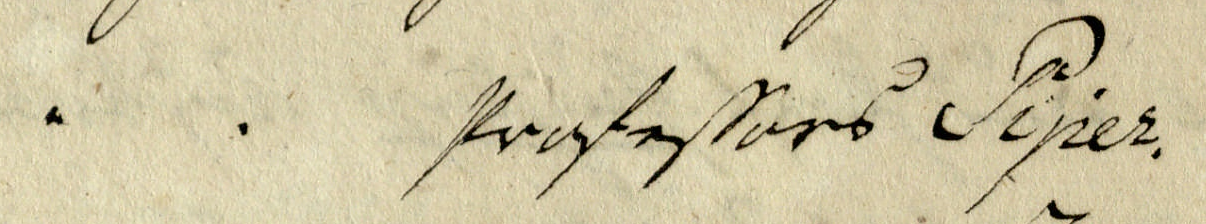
Professors Piper.
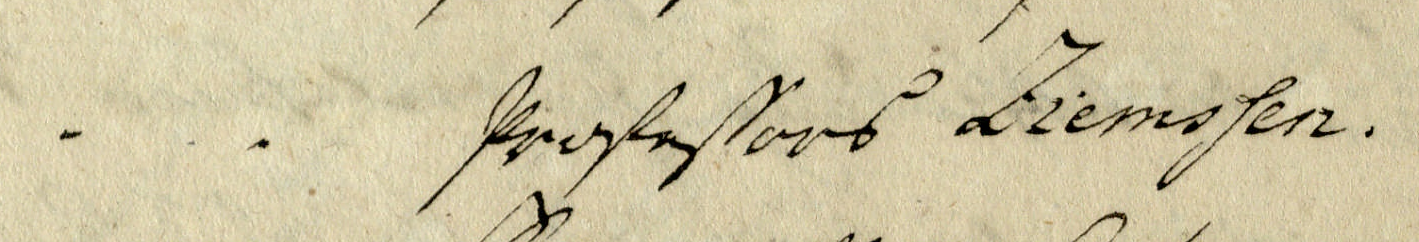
Professors Ziemssen.
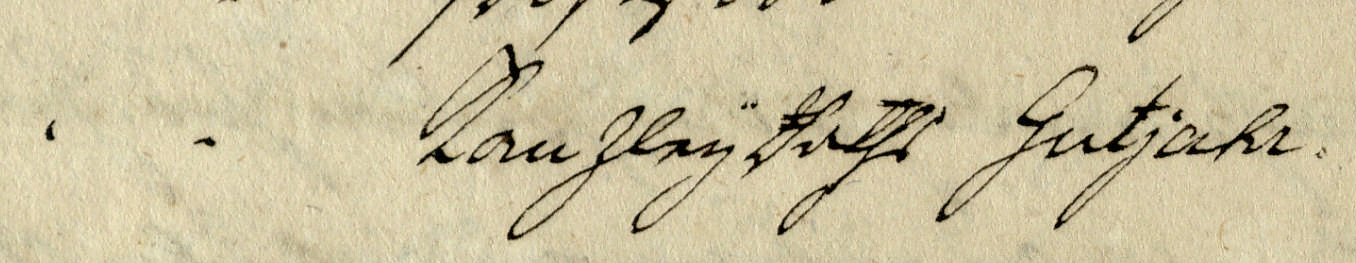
Kanzleÿ Raths Gutjahr.
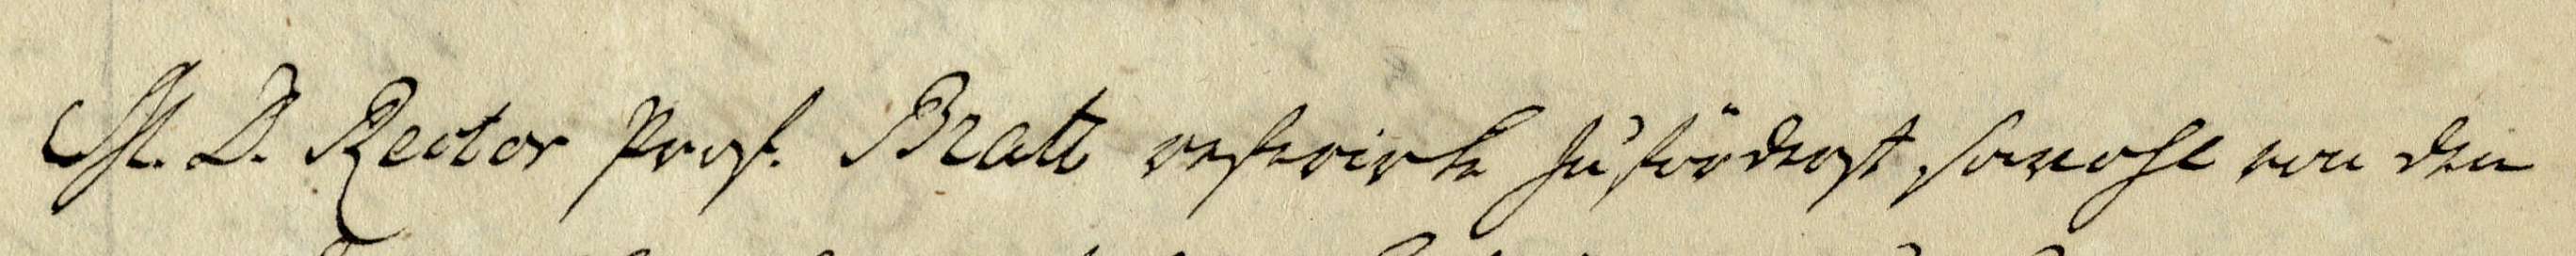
M. D. Rector Prof. Bratt referirte zuförderst sowohl von den
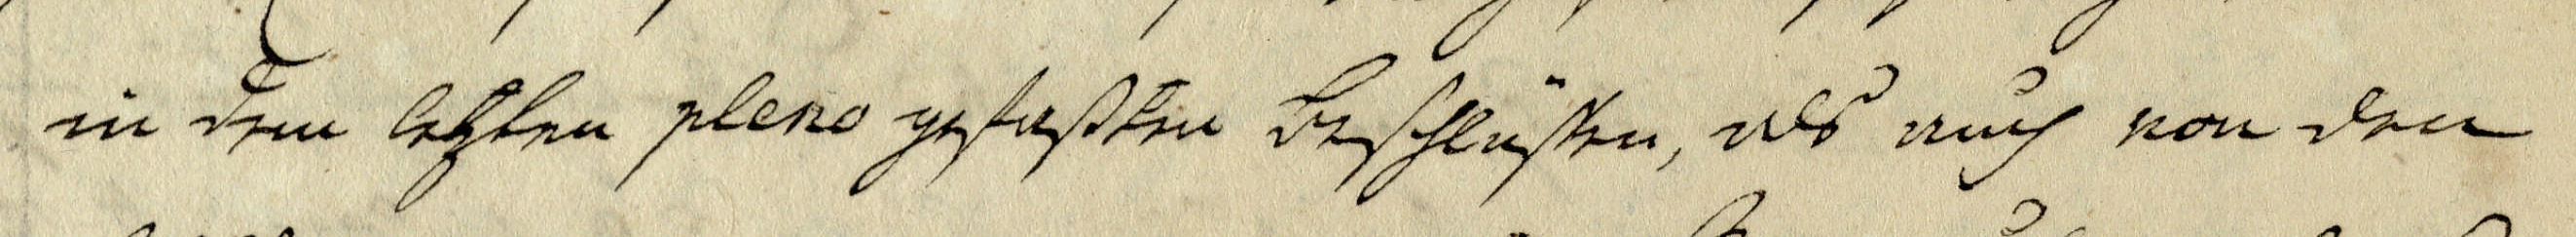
in dem letzten pleno gefaßten Beschlüssen, als auch von den
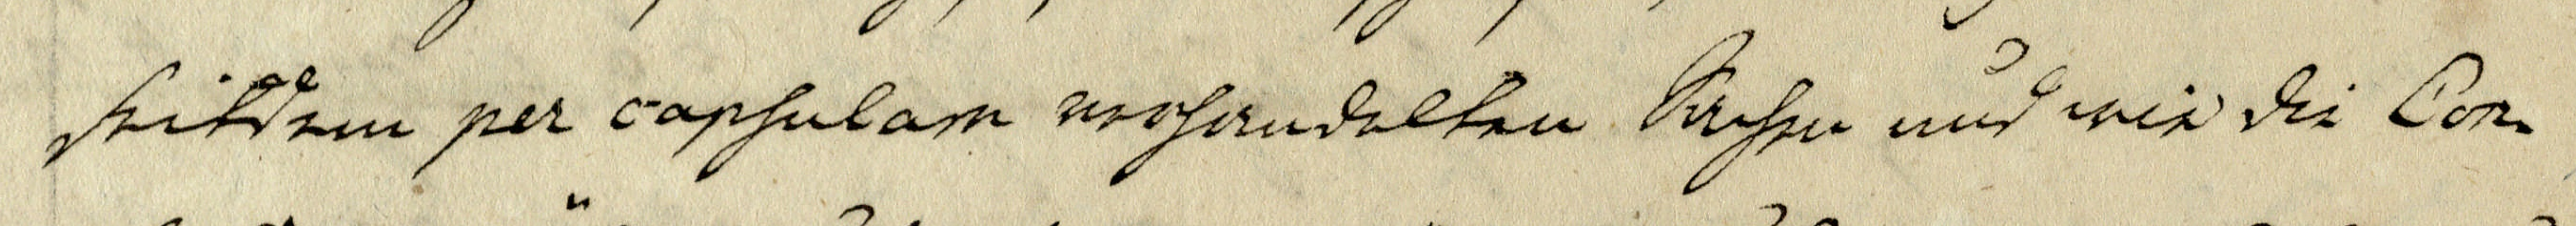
seitdem per capsulam verhandelten Sachen und wie die Con¬
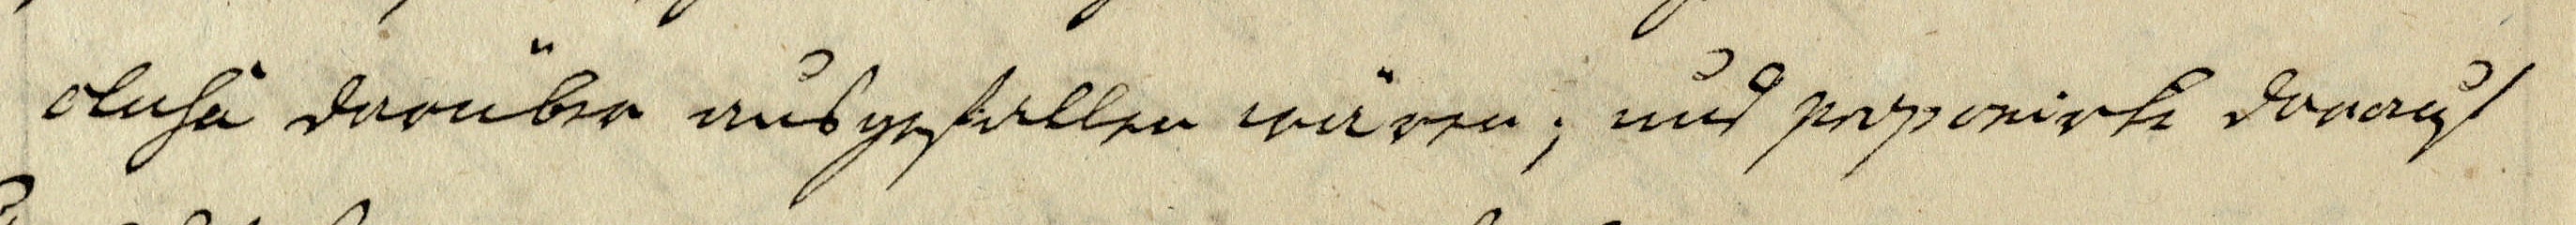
clusa darüber ausgefallen wären; und proponirte darauf
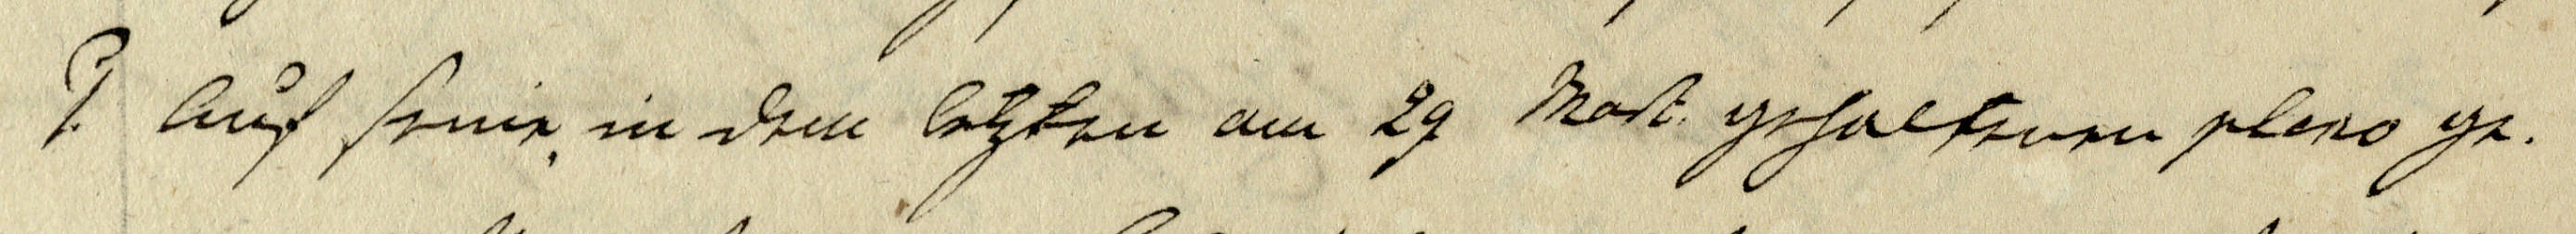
1. Auf seine, in dem letzten am 29 Mart gehaltenen pleno ge¬
